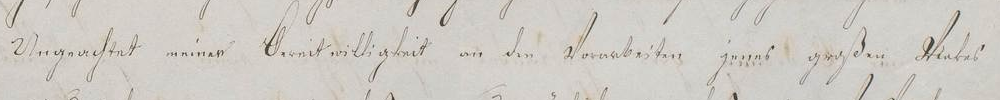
Ungeachtet meiner Bereitwilligkeit an den Vorarbeiten jenes großen Werkes
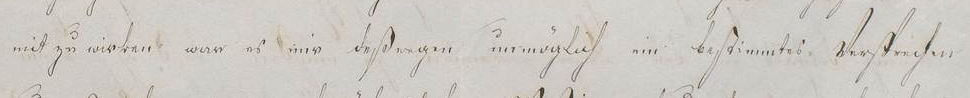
mit zu wirken war es mir deßwegen unmöglich ein bestimmtes Versprechen
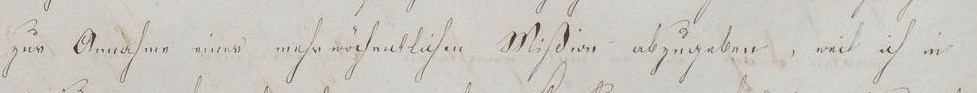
zur Annahme einer mehr wöchentlichen Mißion abzugeben, weil ich in
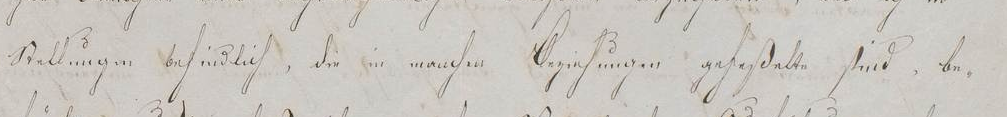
Stellungen befindlich, die in manchen Beziehungen gefeßelte sind, be-
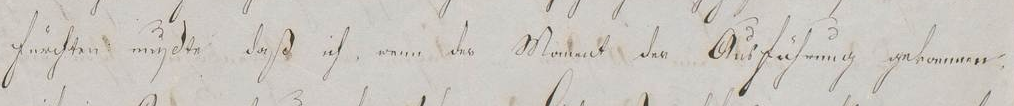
fürchten musste daß ich, wenn der Moment der Ausführung gekommen,
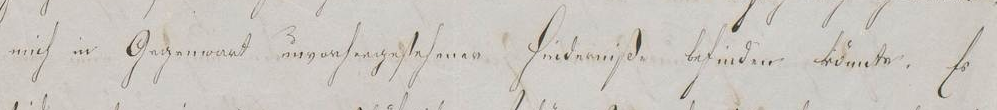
mich in Gegenwart unvorhergesehener Hinderniße befinden könnte. Es
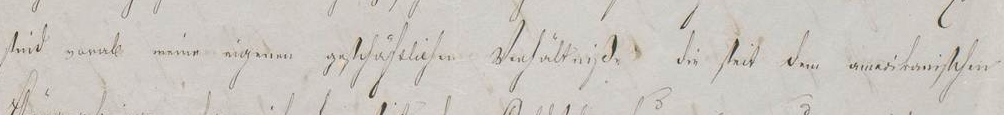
sind einmal meine eigenen geschäftlichen Verhältniße die seit dem amerikanischen
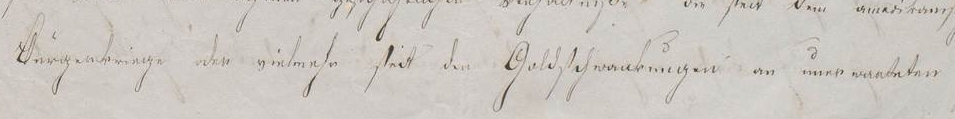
Bürgerkriege oder vielmehr seit den Goldschwankungen an unerwarteten
